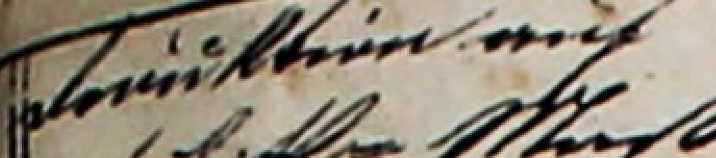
Reduktion auf
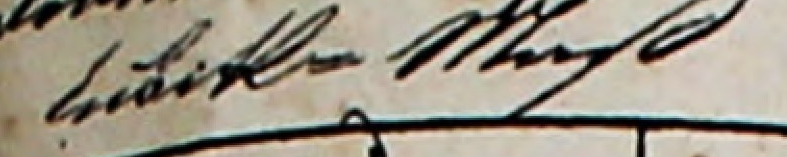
Cubik= Maß
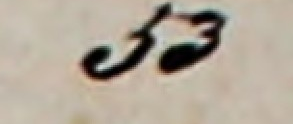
53
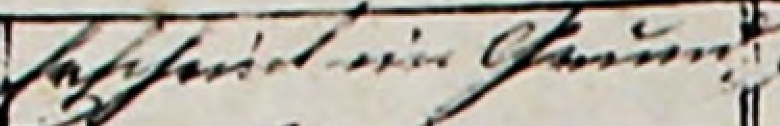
Erscheint im Grund„
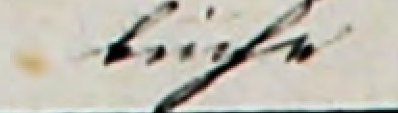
buche
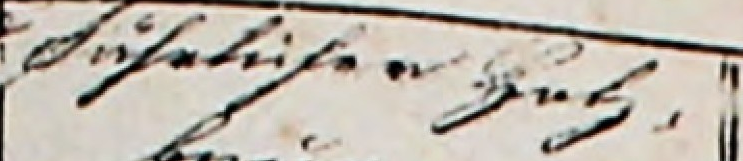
Jährlicher Holz„
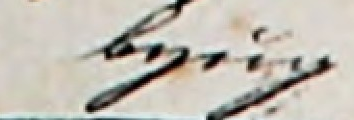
bezug
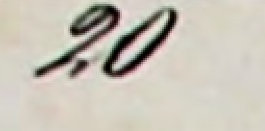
20
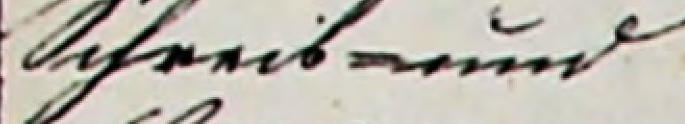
Schreib = und
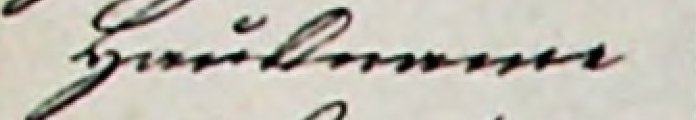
Hausmann
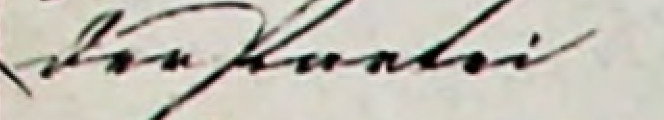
der Partei
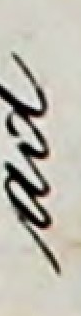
ad
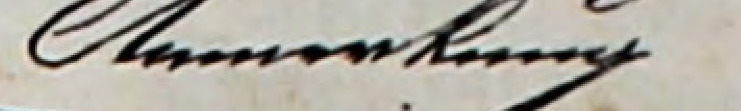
Anmerkung
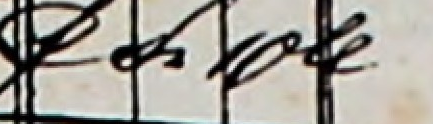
???
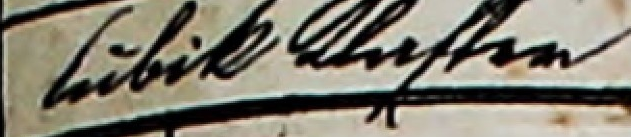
Cubik Klafter
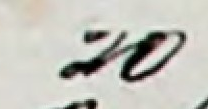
20
